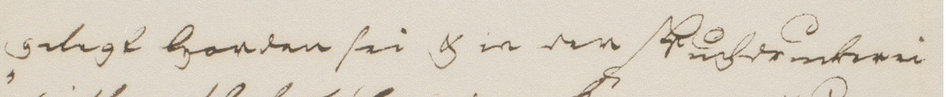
gelegt worden sei & in der Buchdruckerei
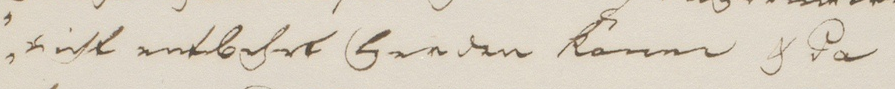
nicht entbehrt werden könne & da-
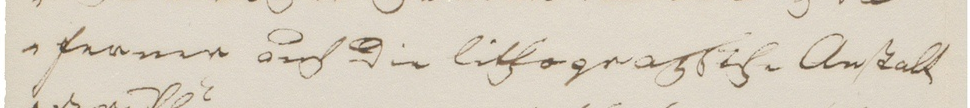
ferner auch die lithographische Anstalt
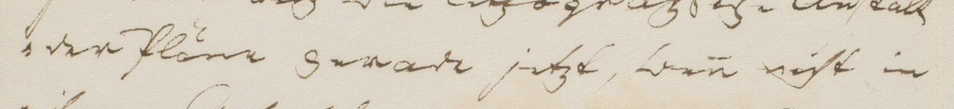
der Pläne gerade jetzt, wenn nicht in
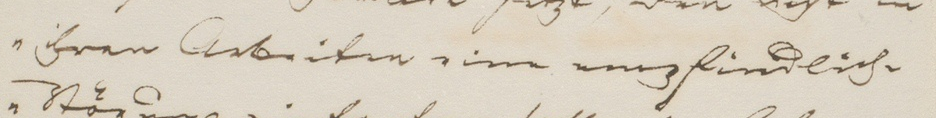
ihren Arbeiten eine empfindliche
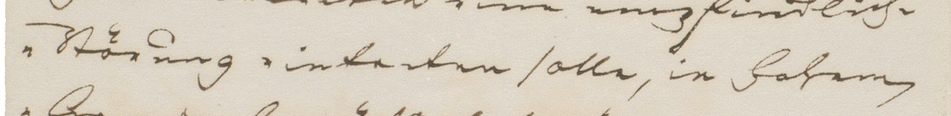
Störung eintreten solle, in hohem
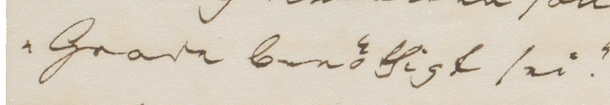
Grade benöthigt sei.»
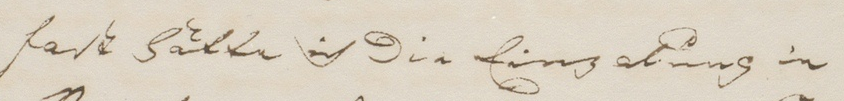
Fast hatte ich die Einzalung in
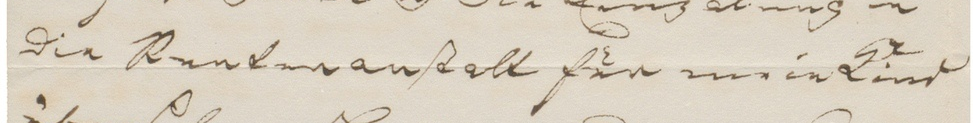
die Rentenanstalt für mein Kind
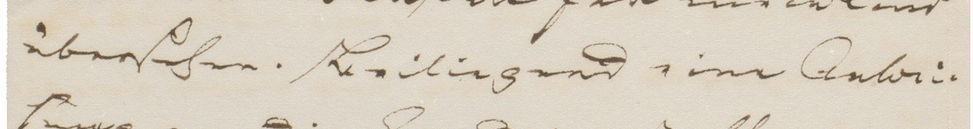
übersehen. Beiliegend eine Anwei-
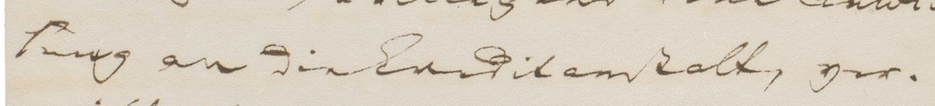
sung an die Kreditanstalt, ver-
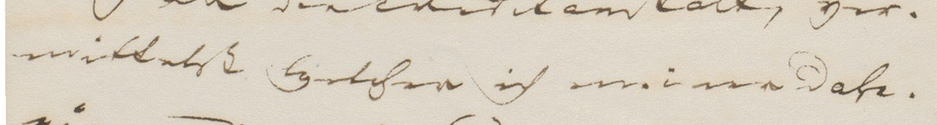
mittelst welcher ich meiner dahe-
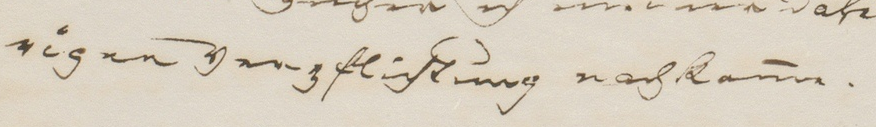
rigen Verpflichtung nachkomme.
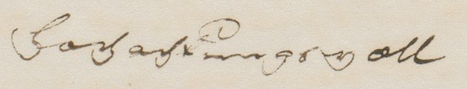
Hochachtungsvoll
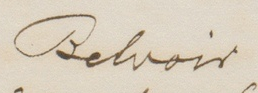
Belvoir
